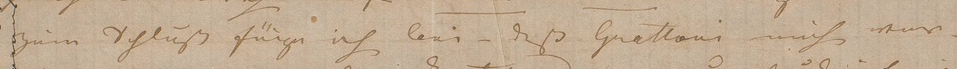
Zum Schluß füge ich bei – daß Grattoni mich ver-
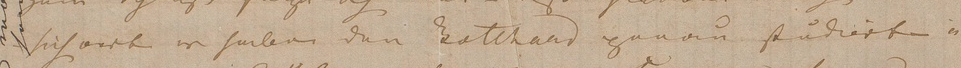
sichert er habe den Gotthard genau studiert u
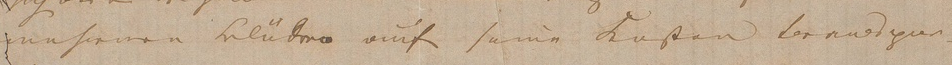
mehrere Blöke auf seine Kosten transpor-
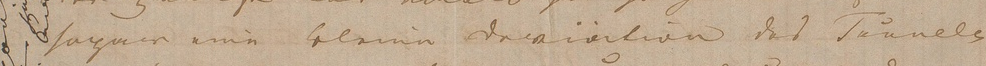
sogar eine kleine Deviation des Tunnels
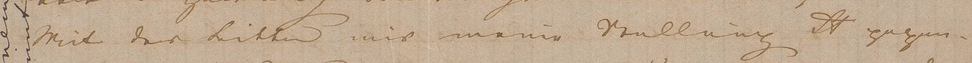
Mit der Bitte mir meine Stellung St gegen-
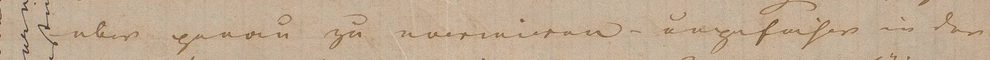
über genau zu normiren – ungefähr in der
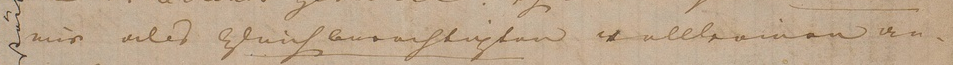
mir als Gleichberechtigten vollkomen an-
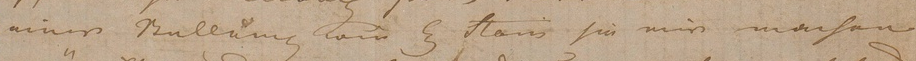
einer Stellung wie Herr Stamm sie mir machen
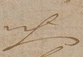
ergebener
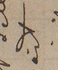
das
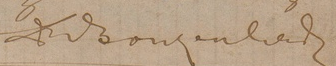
Vertagung einen Fehler
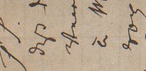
de decembre.
